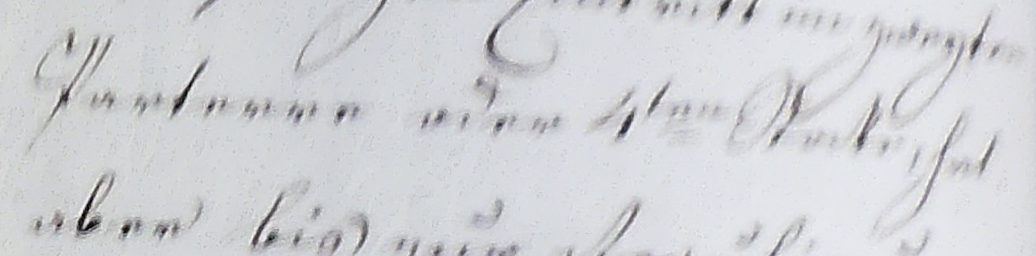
Parterre oder 4te͇n Stock, hat
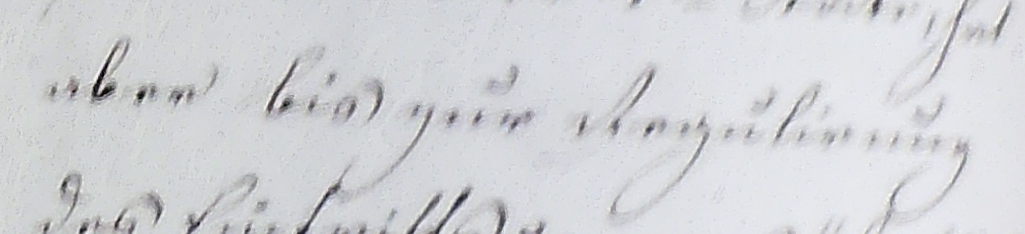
aber bis zur Regulirung
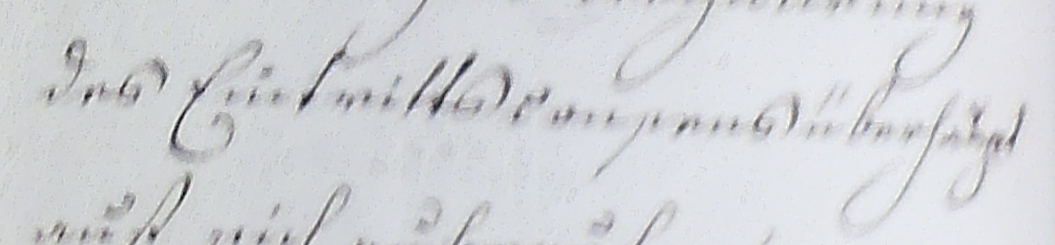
des Entrittsconsens überhaupt
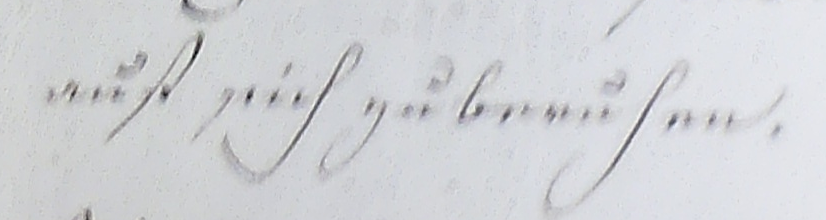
auf sich zuberufen.
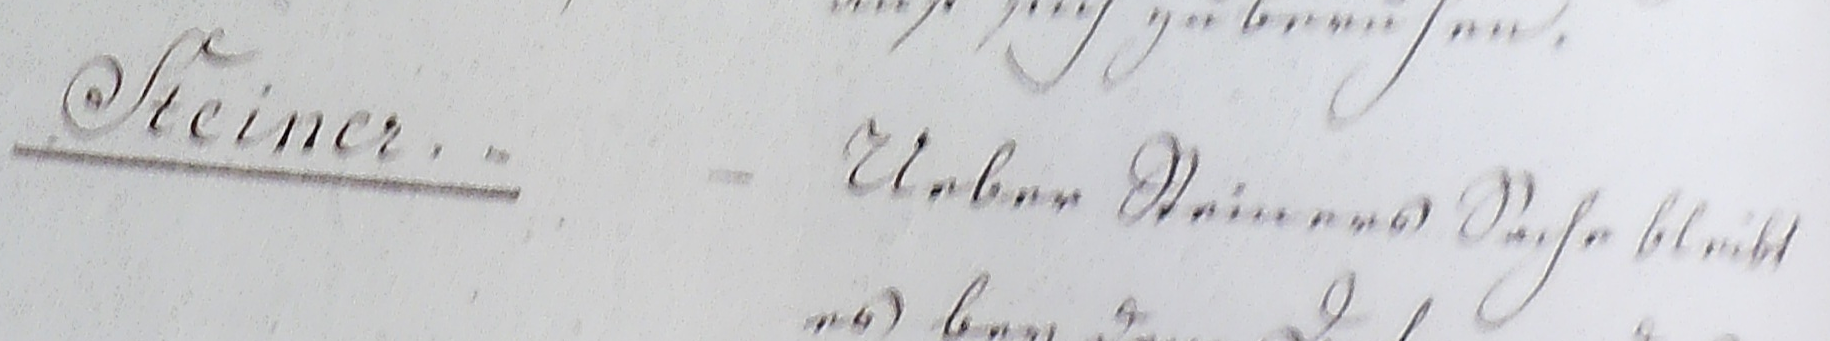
Steiner. .. - Ueber Steiners Sache bleibt
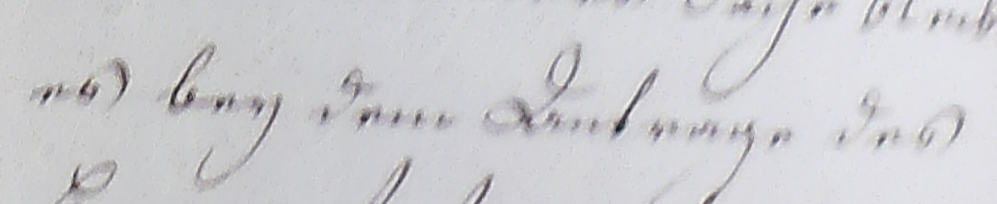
es bey dem Antrage des
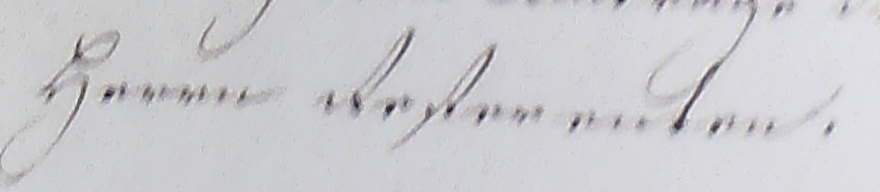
Herrn Referenten.
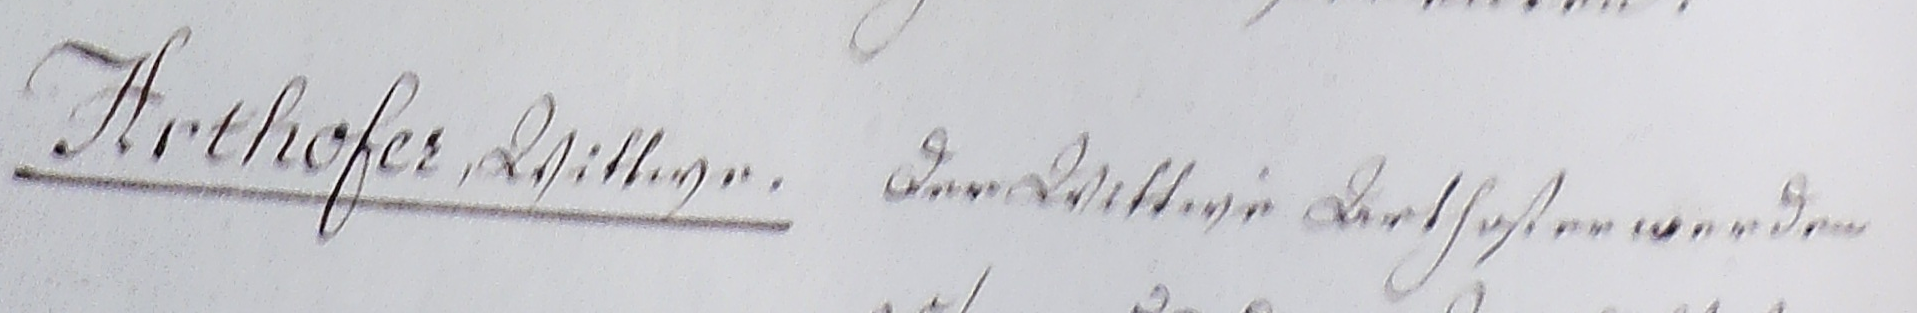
Arthofer, Wittwe. Der Witwe Arthofer werden
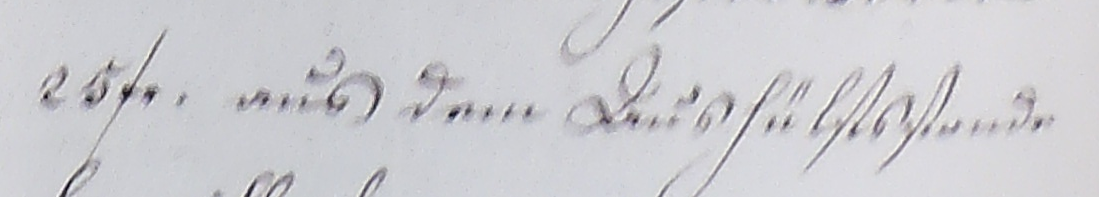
25fr. aus dem Aushülflsfonde
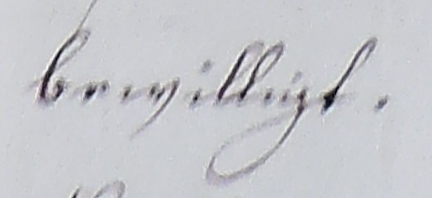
bewilligt.
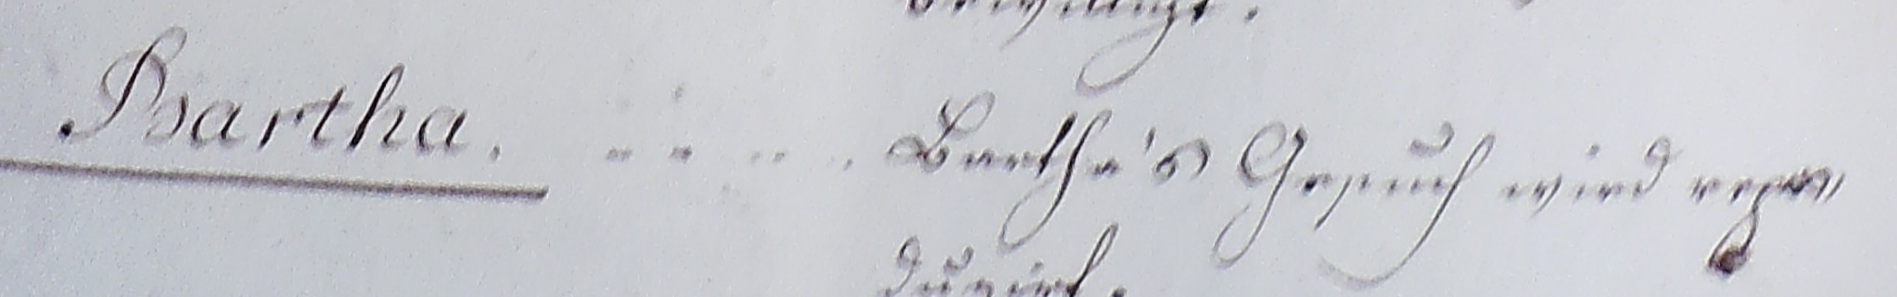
Bartha. .. .. .. Bartha's Gesuch wird repro
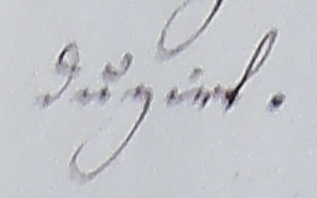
duzirt.
